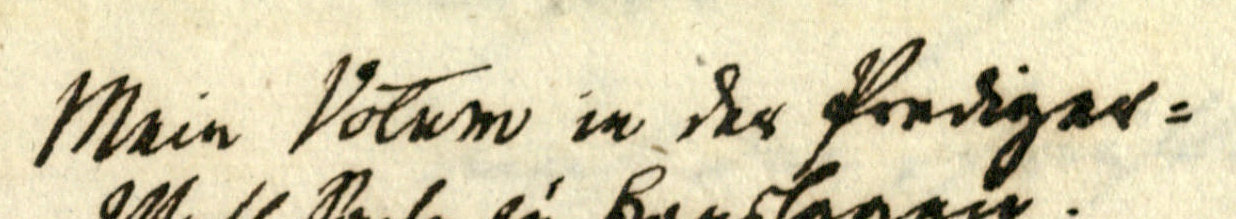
Mein Votum in der Prediger¬
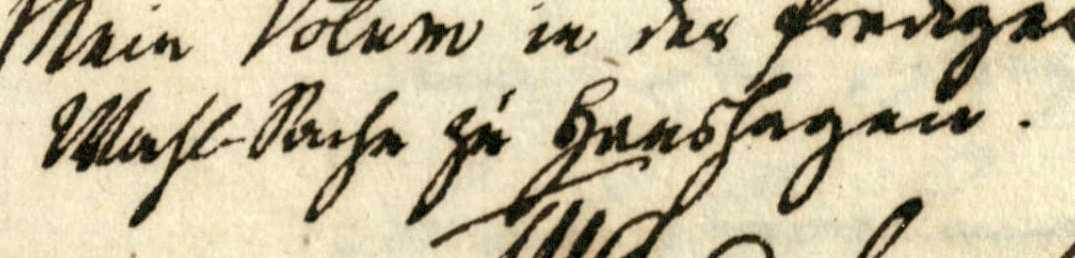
Wahl Sache zu Hanshagen.
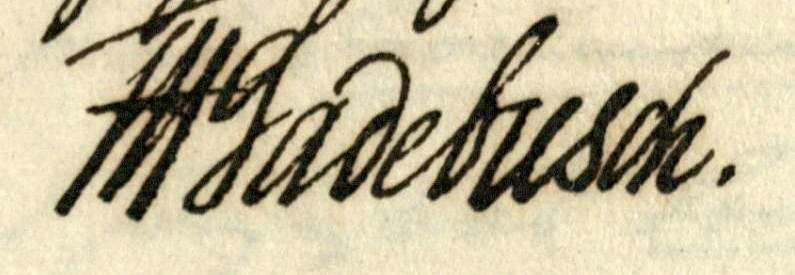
Gadebusch.
